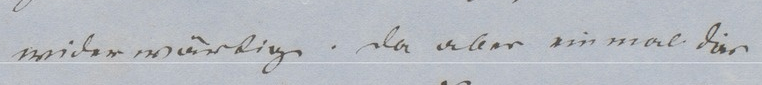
widerwärtig. Da aber einmal das
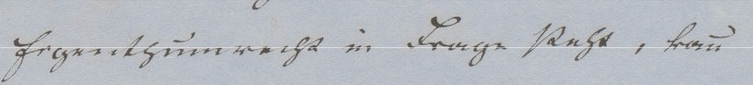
Eigenthumrecht in Frage steht, kann
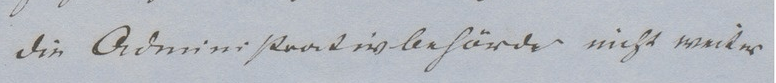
die Administrativbehörde nicht weiter
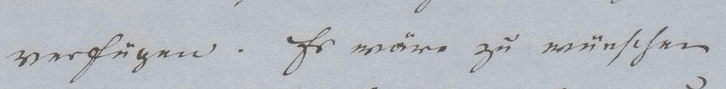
verfügen. Es wäre zu wünschen
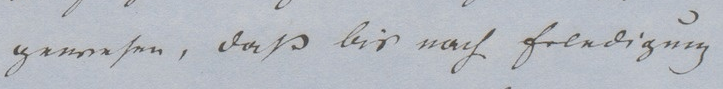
gewesen, daß bis nach Erledigung
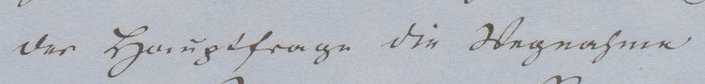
der Hauptfrage die Wegnahme
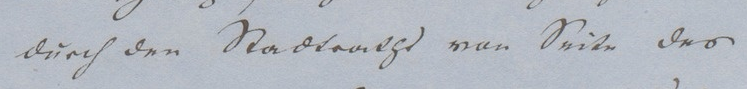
durch den Stadtrath von Seite des
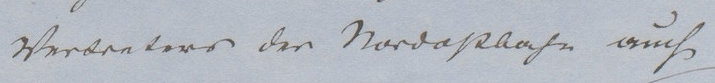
Vertreters der Nordostbahn auch
